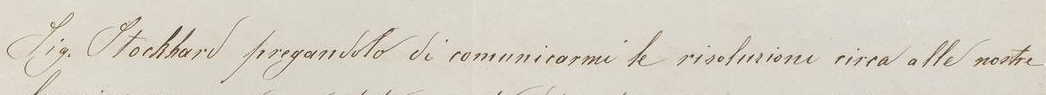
Sig. Stockhard pregandolo di comunicarmi le risoluzione circa alle nostre
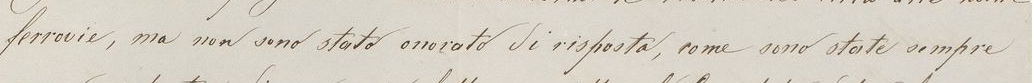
ferrovie, ma non sono stato onorato di risposta, come sono state sempre
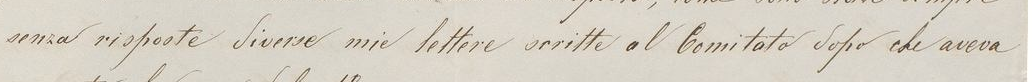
senza risposte diverse mie lettere scritte al Comitato dopo che aveva
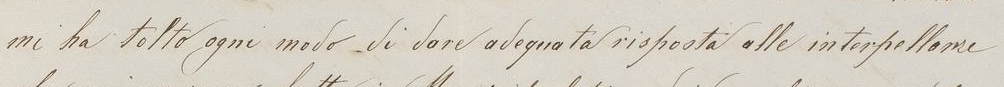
mi ha tolto ogni modo die dare adequata risposta alle interpellanze
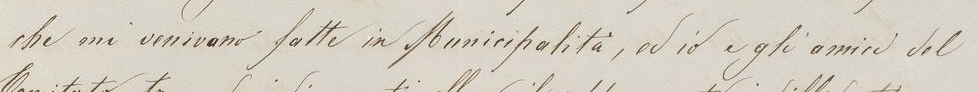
che mi venivano fatte in Municipalità, ed io e gli amici del
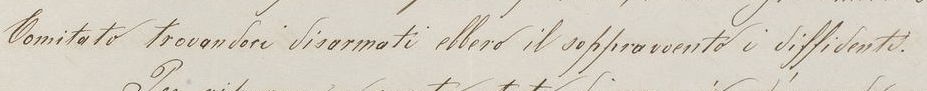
Comitato trovandoci disarmati ebbero il soppravvento i diffidenti.
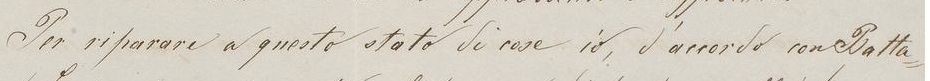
Per riparare a questo stato di case io, d'accordo con Batta-
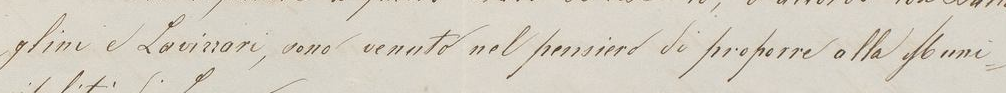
glini e Lavizzari, sono venuto nel pensiero di proporre alla Muni-
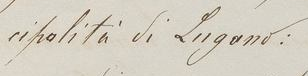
cipalità di Lugano:
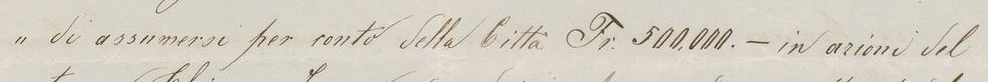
«Si assumersi per conto della Città Fr. 500.000.– in azioni del
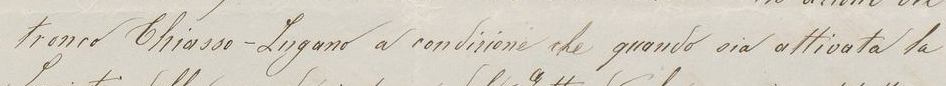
tronco Chiasso–Lugano a condizione che quando sia attivata la
